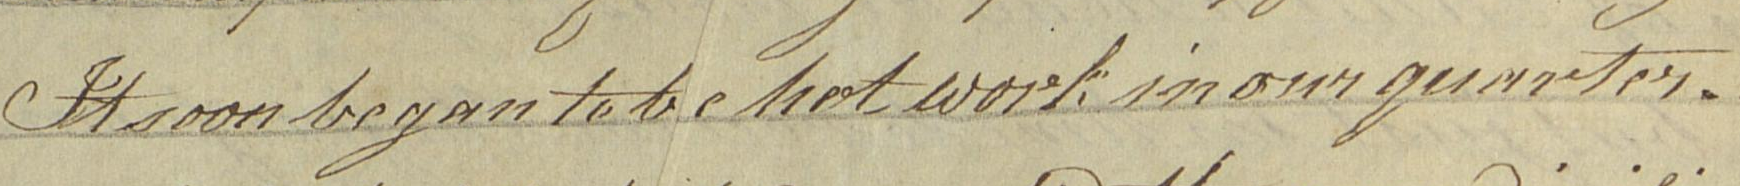It soon began to be hot work in our quarter.
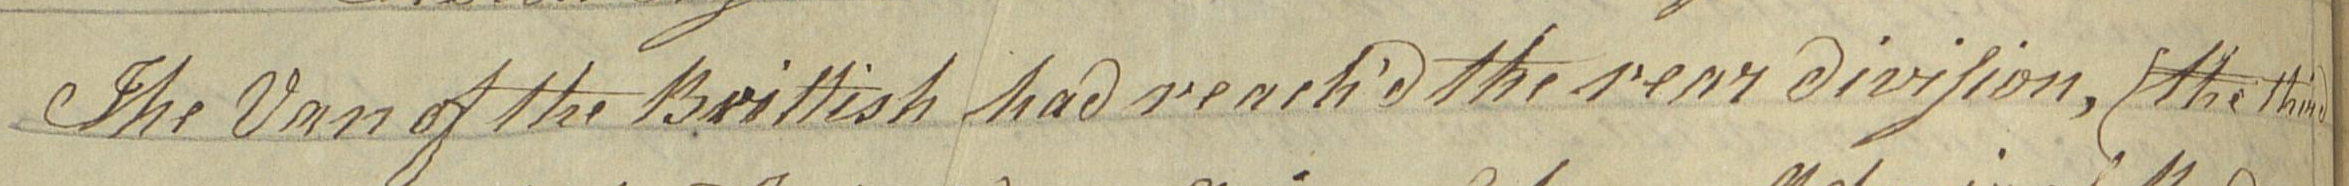The Van of the Brittish had reach'd the rear division, (the thi-
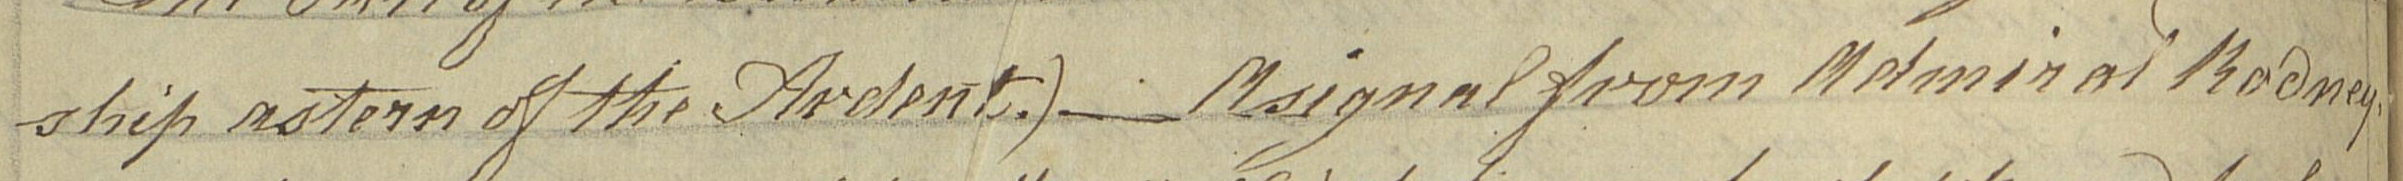ship astern of the Ardent.) A signal from Admiral Rodney
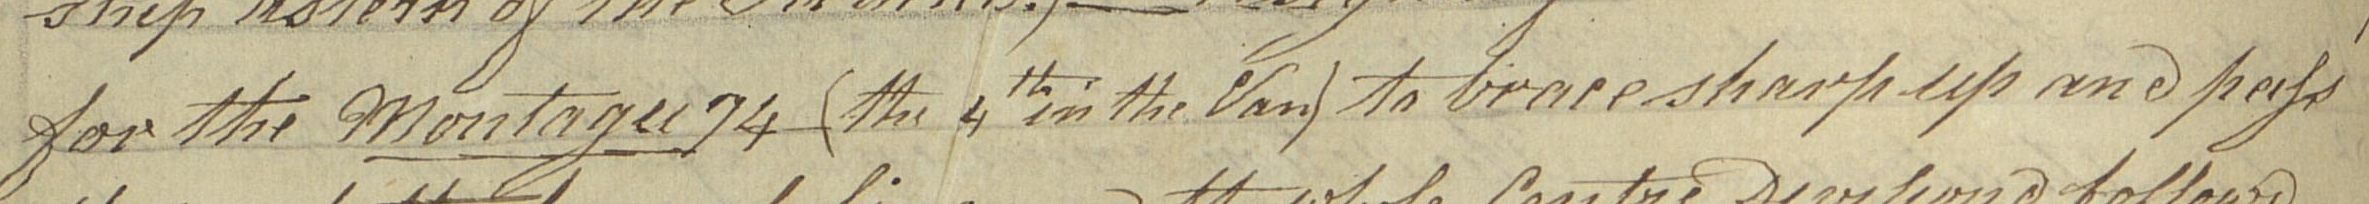for the Montage 74 (the 4^th in the Van) to brace sharp up and pass
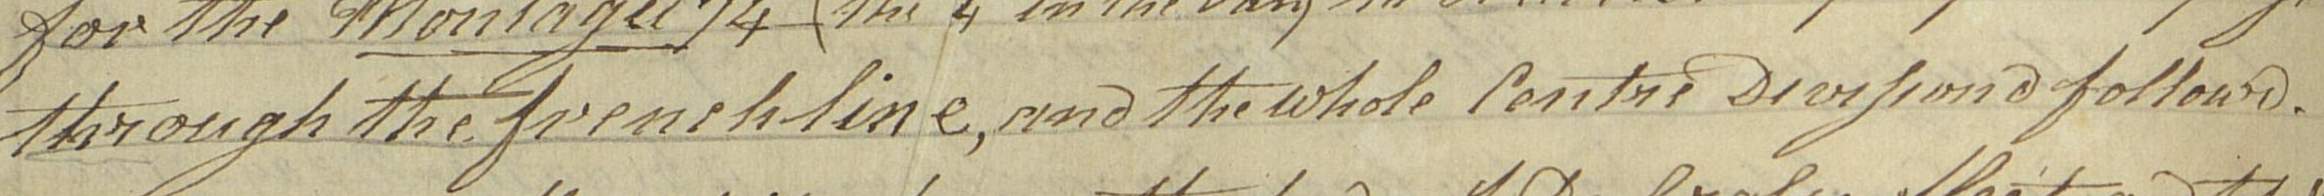through the french line, and the whole Centre division'd followd
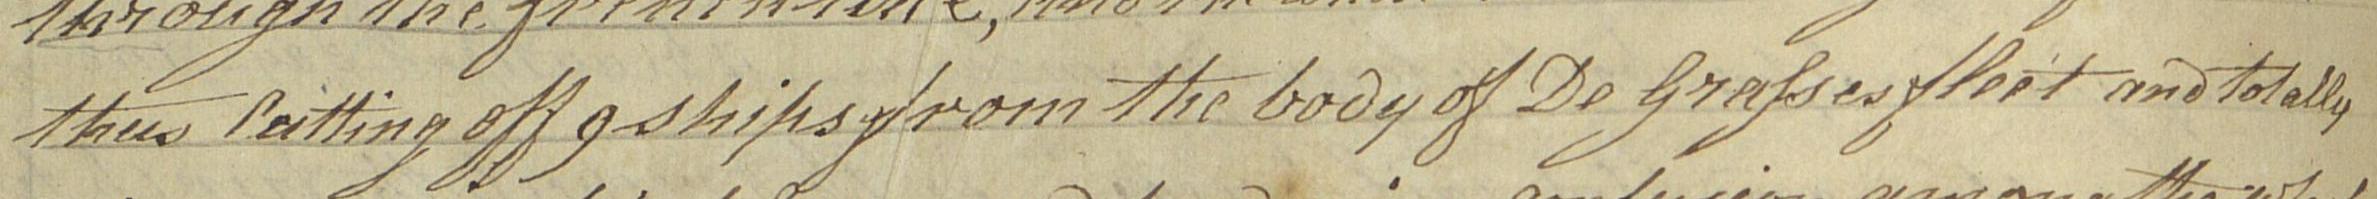thus Cutting off 9 ships from the body of De Grasses fleet and totally
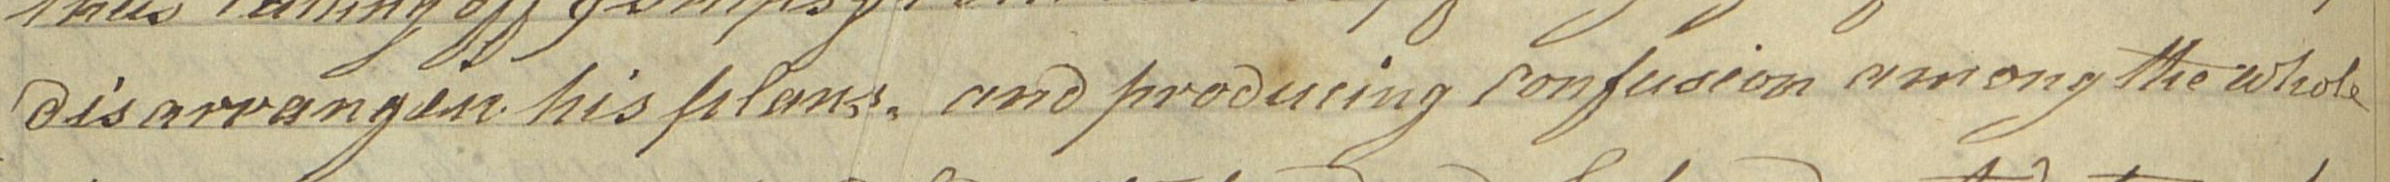disarrang in his plans and producing confusion among the whole
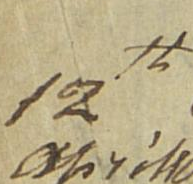12^th
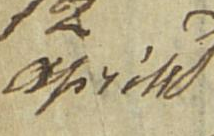Aprill
